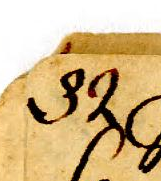32
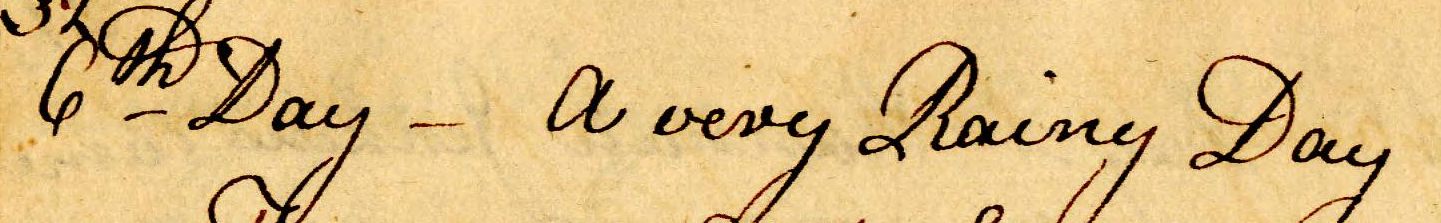6^th Day- A very Rainy Day
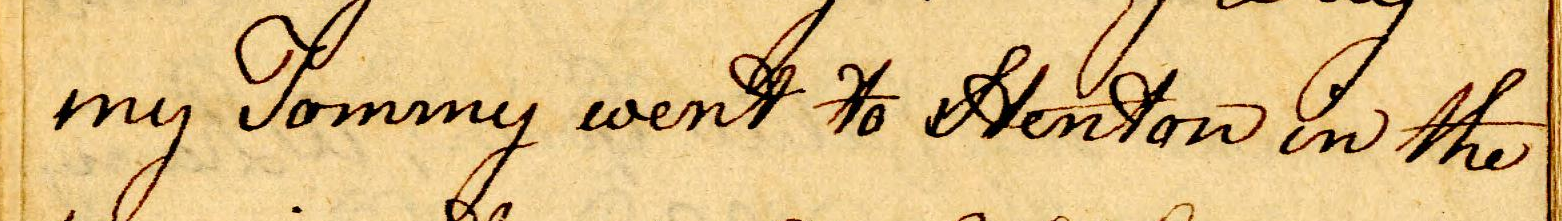my Tommy went to Stenton in the
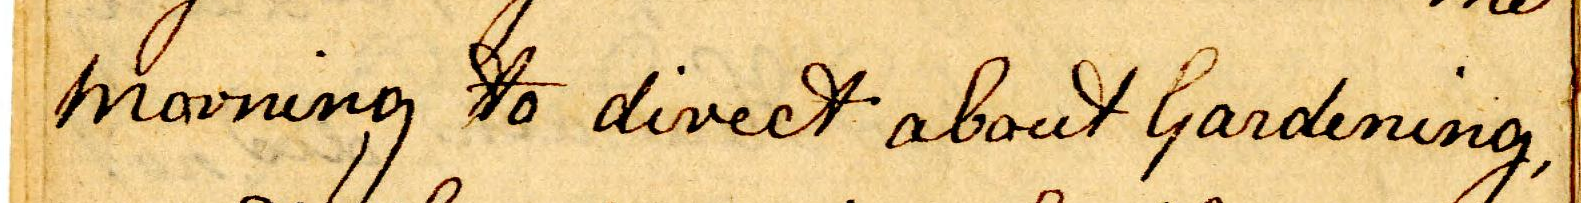morning to direct about Gardening,
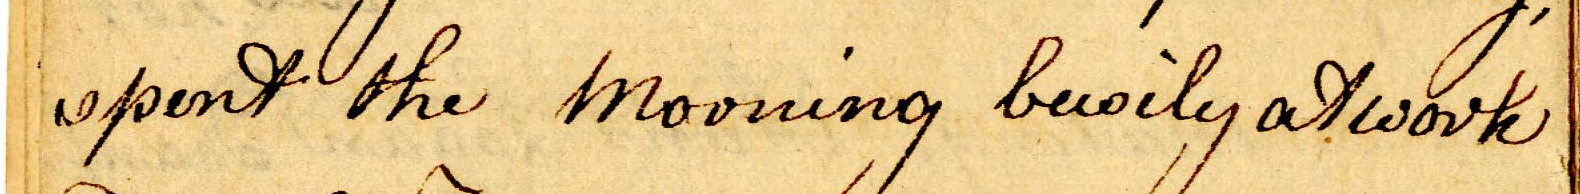spent the Morning busily at work
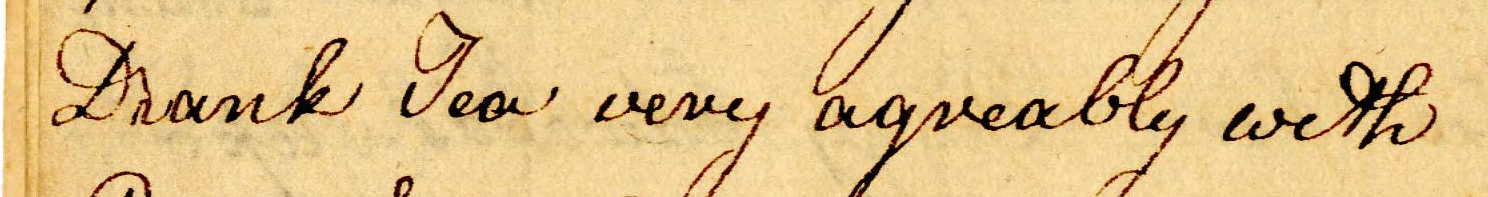Drank Tea very agreably with
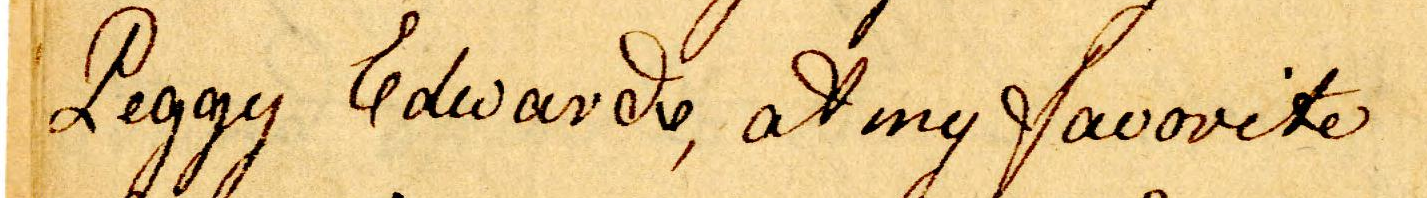Peggy Edwards, at my favorite
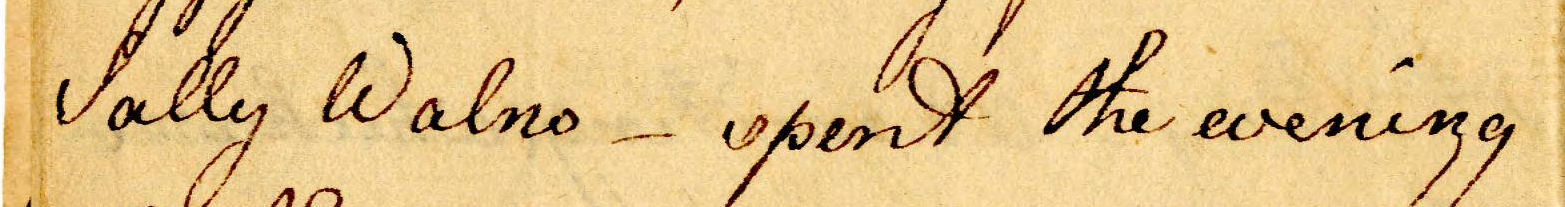Sally Walns- spent the evening
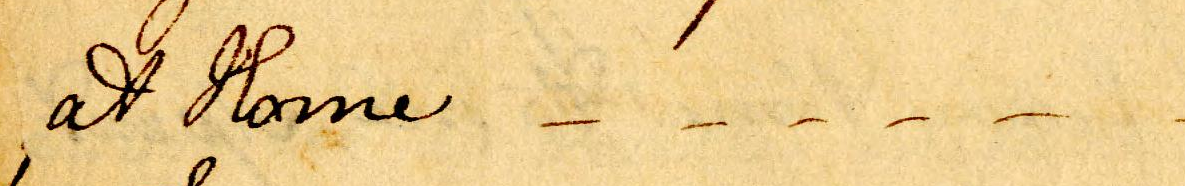at Home-----
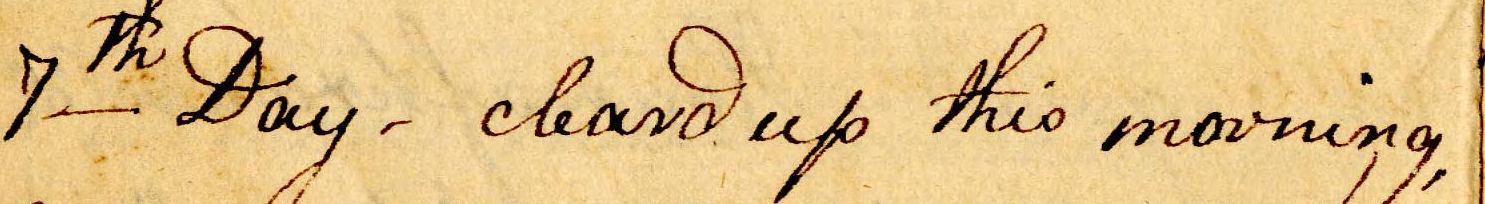7^th Day- cleard up this morning,
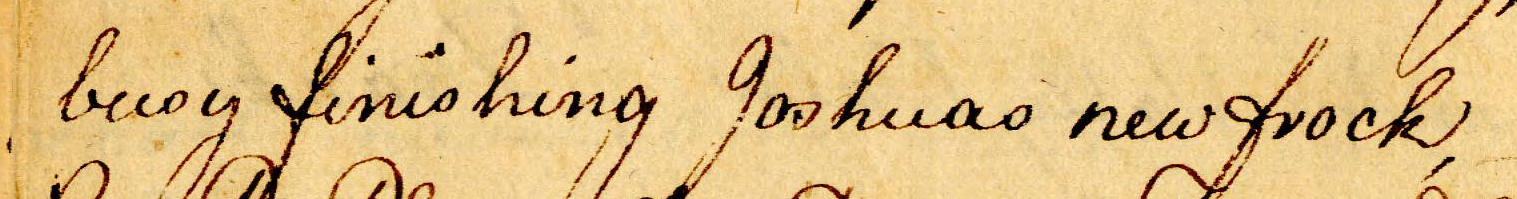busy finishing Joshuas new frock,
